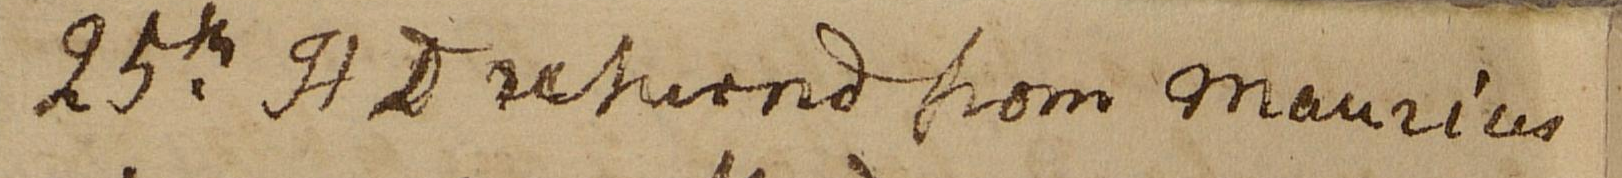25^th. HD returnd from Maurius
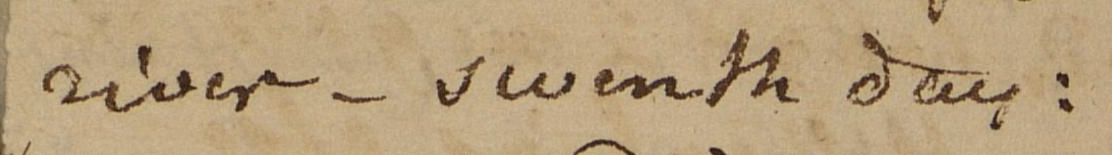River- seventh day:
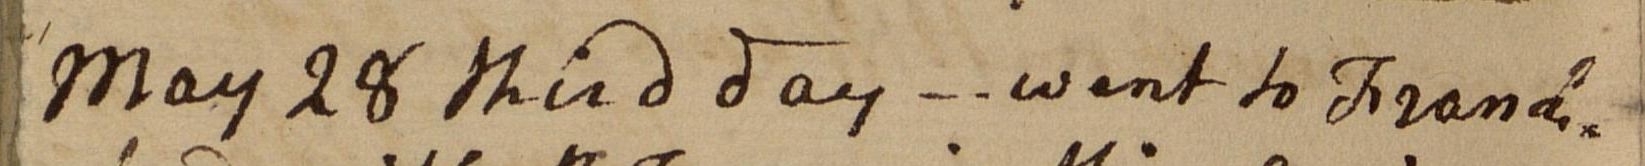May 28 third day- went to Frank-
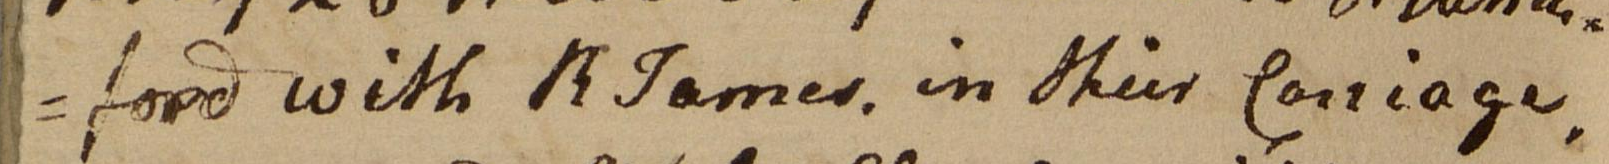-ford with R James, in their Carriage,
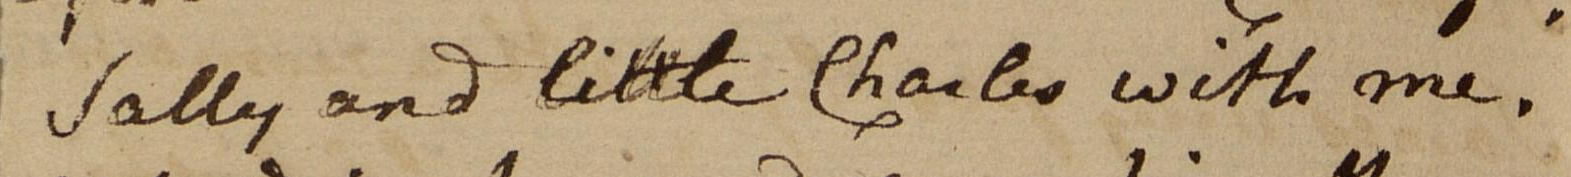Sally and little Charles with me,
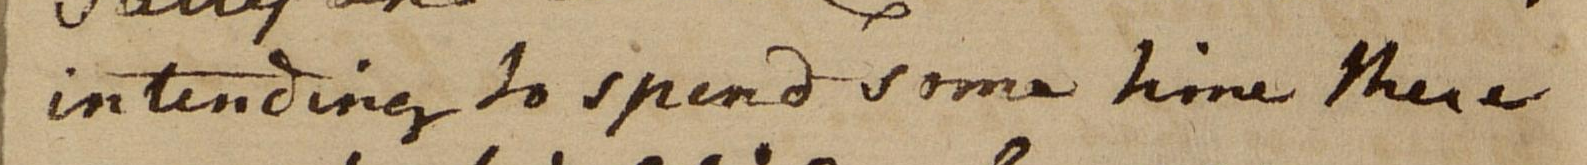intending to spend some time there
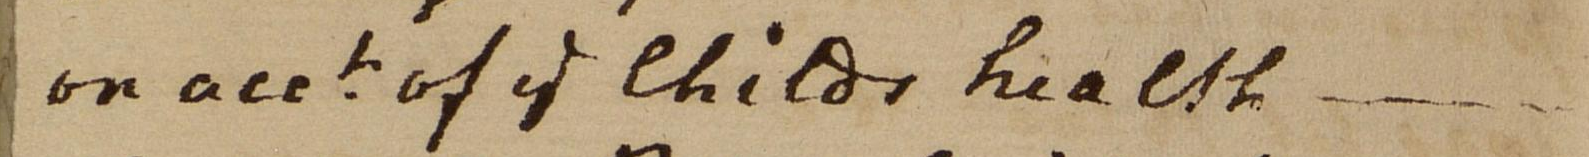on acc^t. of y^e Childs health-
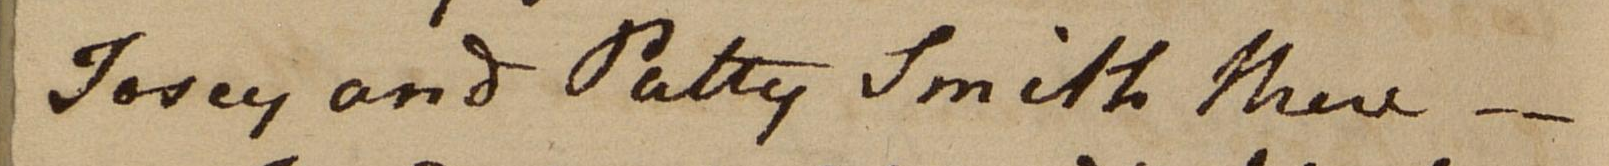Josey and Patty Smith there-
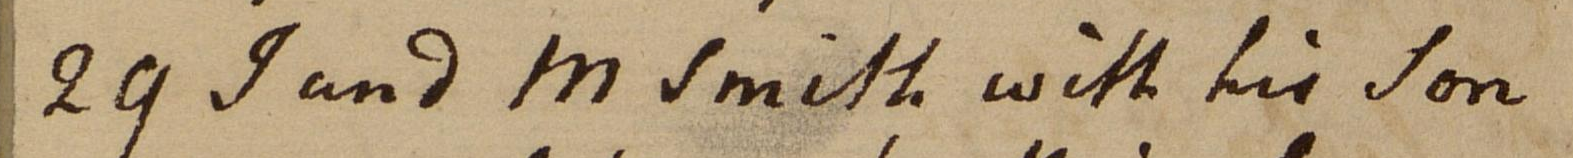29 J and M Smith with his Son
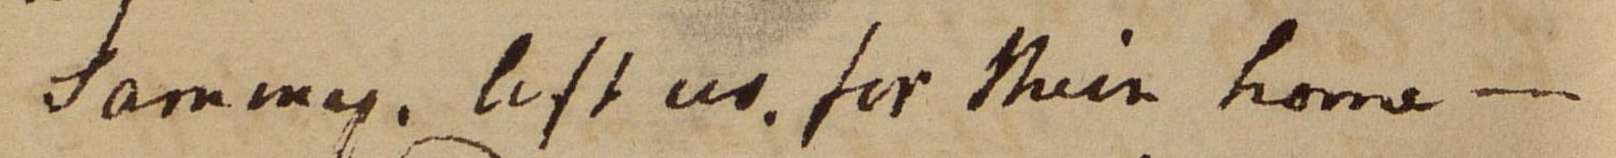Sammy, left us, for their home-
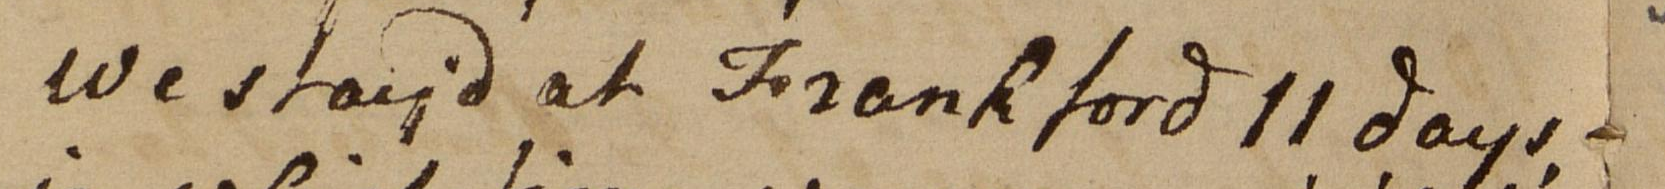we stay'd at Frankford 11 days,
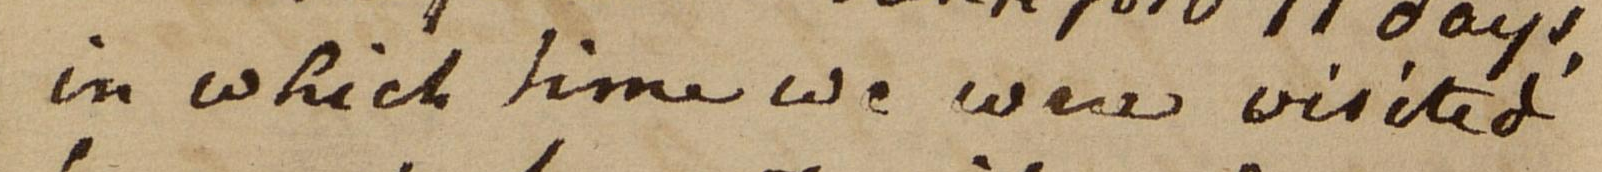in which time we were visited
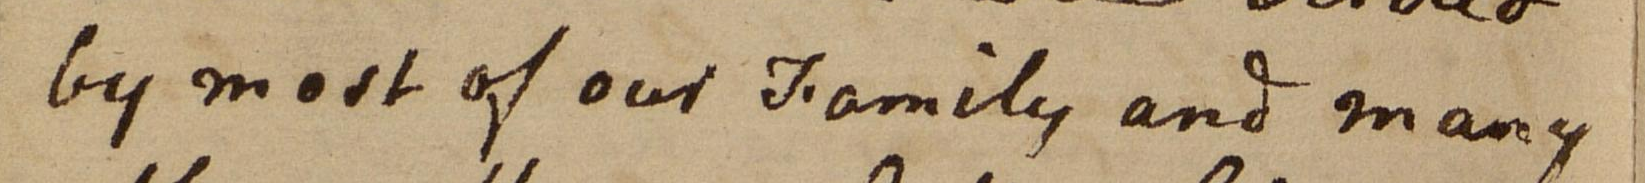by most of our Family and many
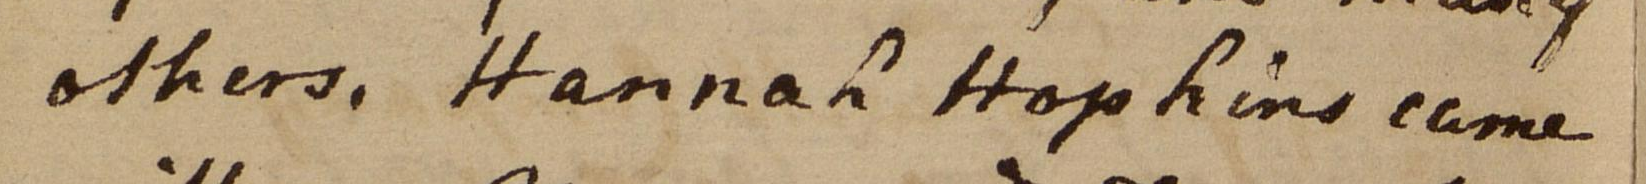others, Hannah Hopkins came
